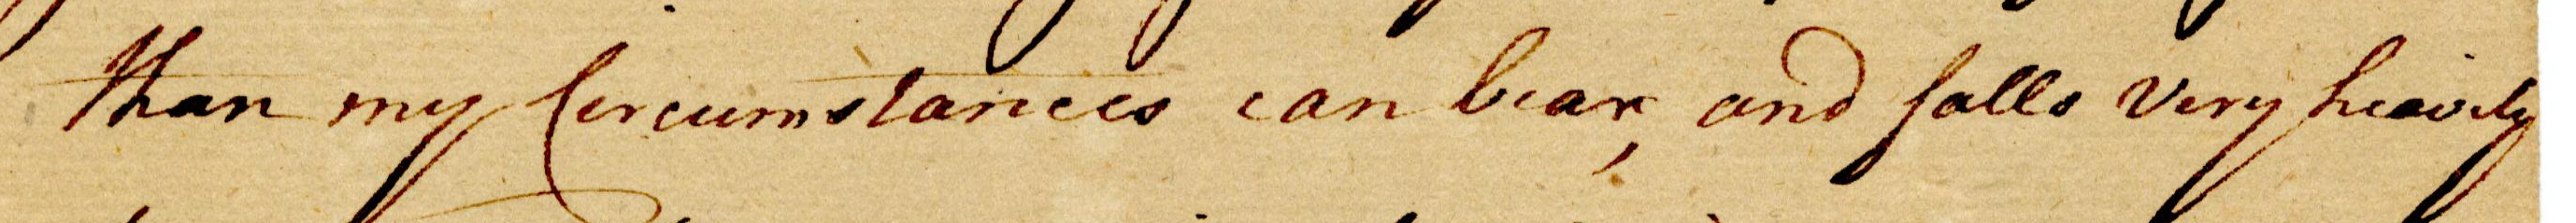than my Circumstances can bear and falls very heavily
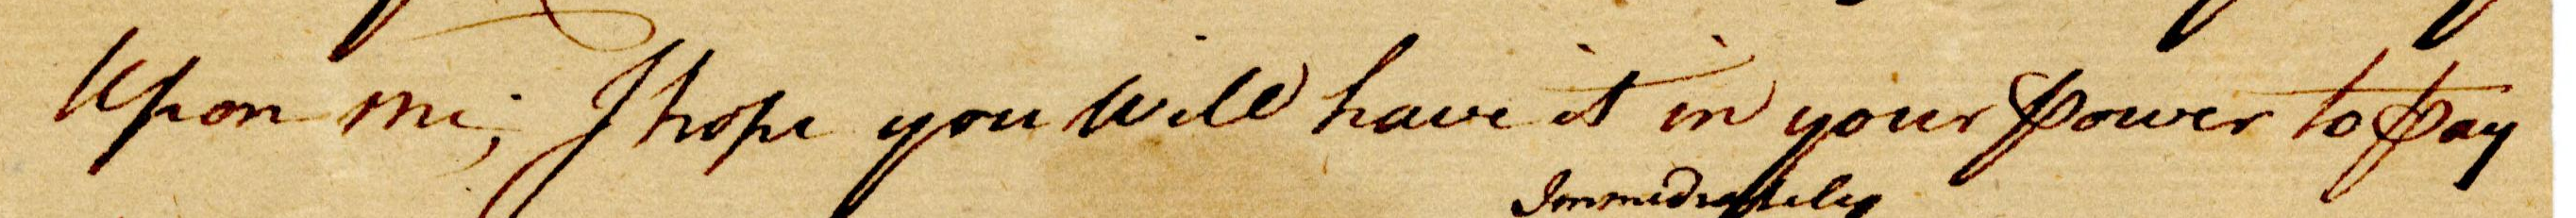upon me, I hope you will have it in your Power to pay
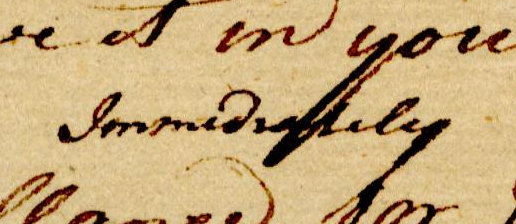Immediately
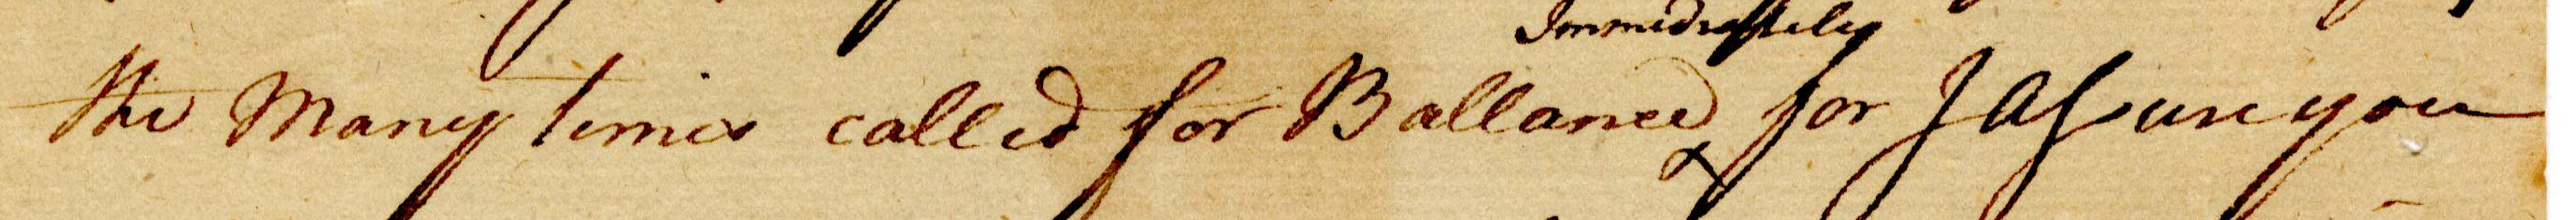the Many times called for Ballance ^ for I asure you
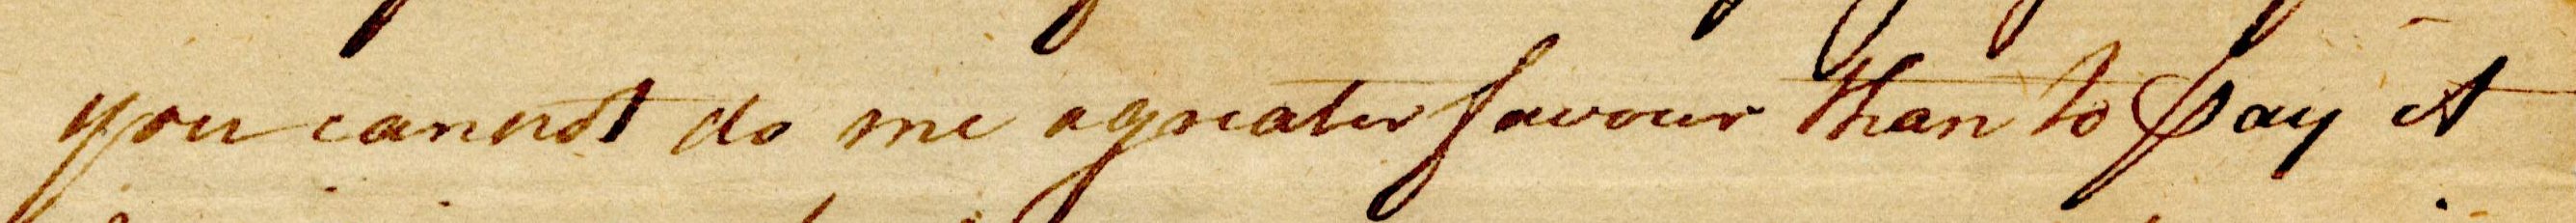you cannot do me a greater favour than to pay it
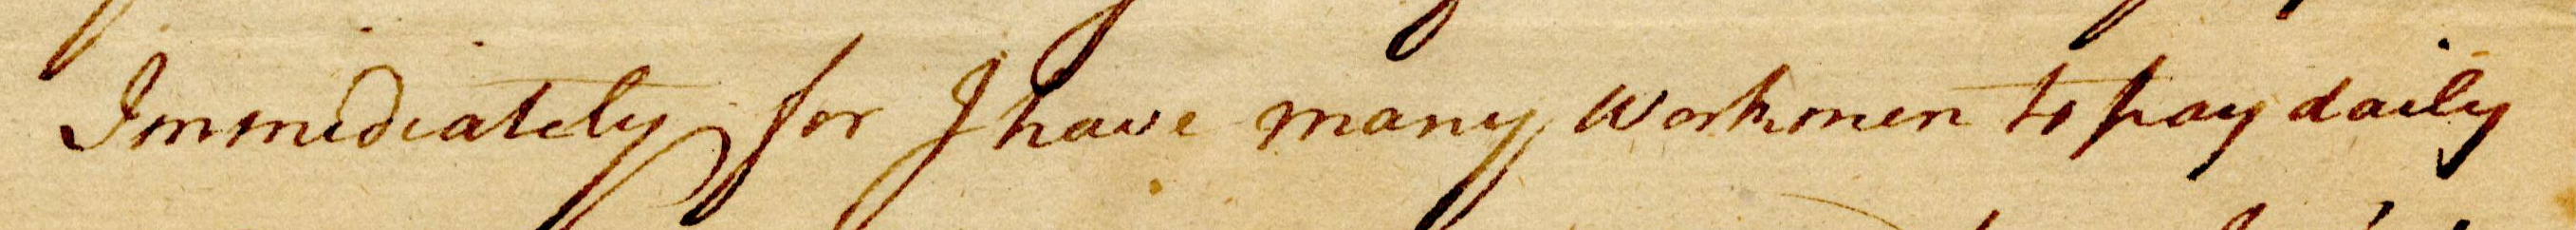Immediately for I have many workmen to pay daily
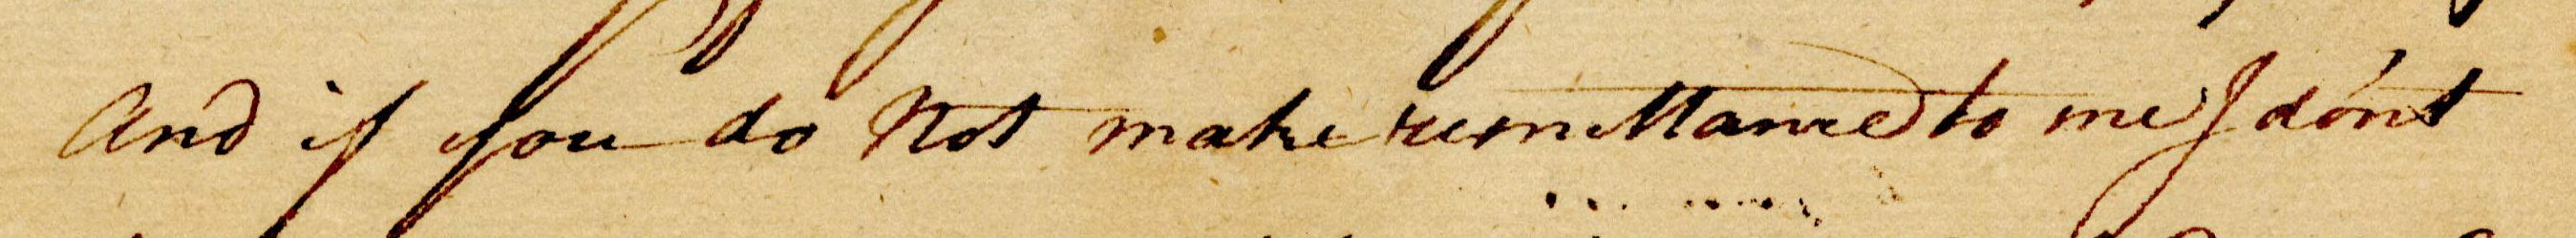And if you do not make remittance to me I dont
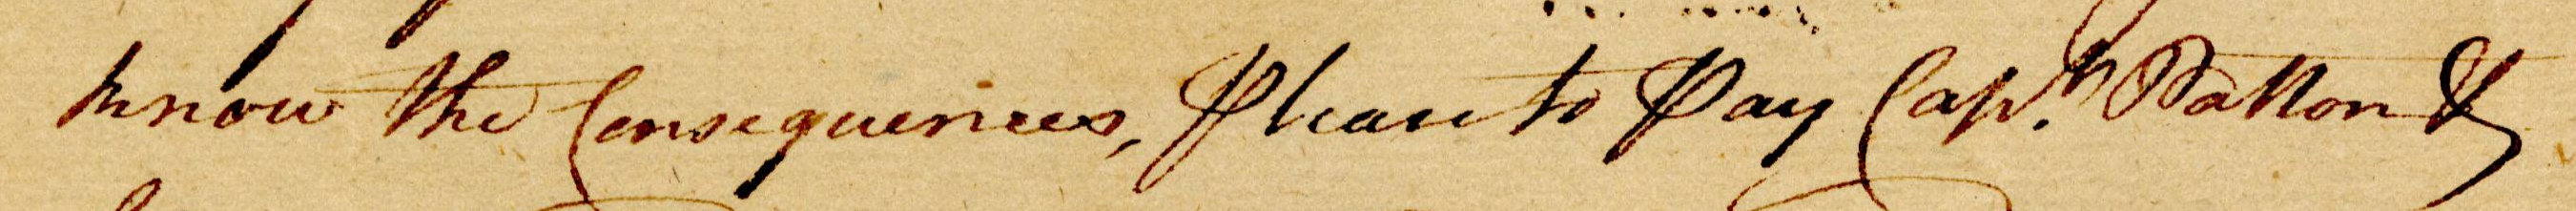know the Consequences Please to Pay Cap^t Patton &
